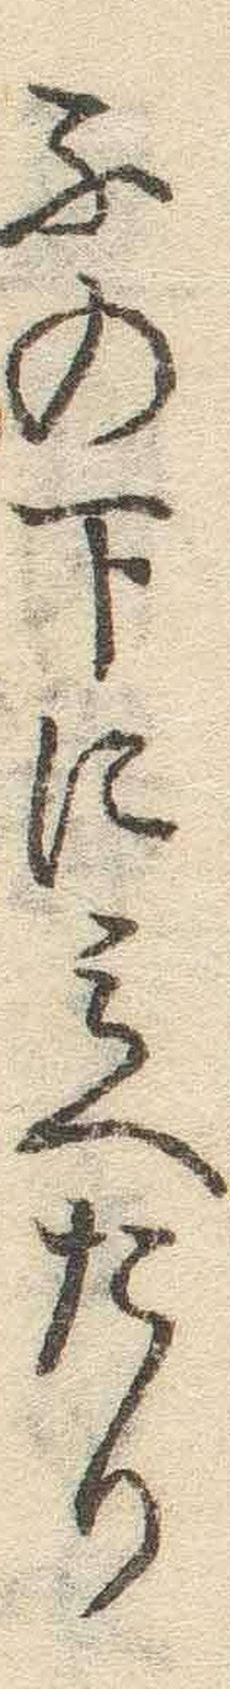ふの下にみへたり
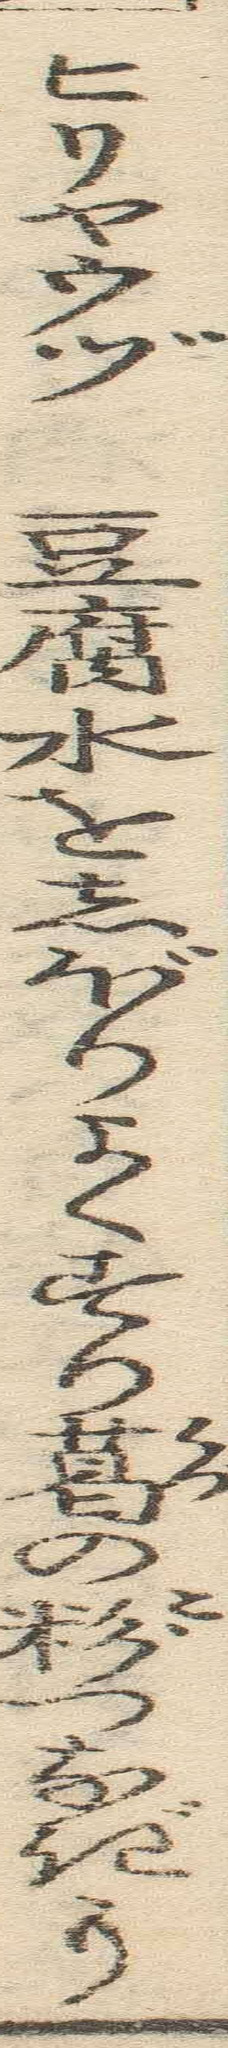[十九]ヒリヤウヅ豆腐水をしぼりよくすり葛の粉つなぎに
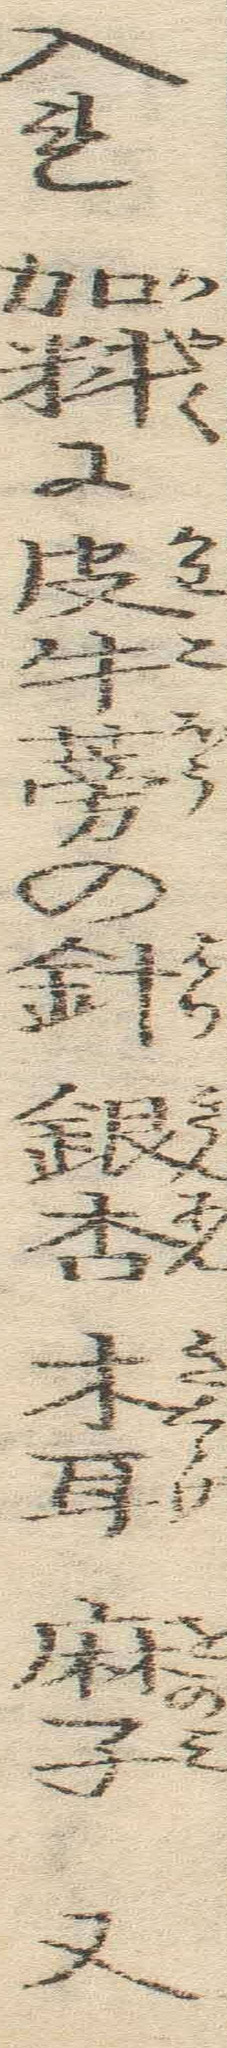入れ加料に皮牛蒡の針銀杏木耳麻子又
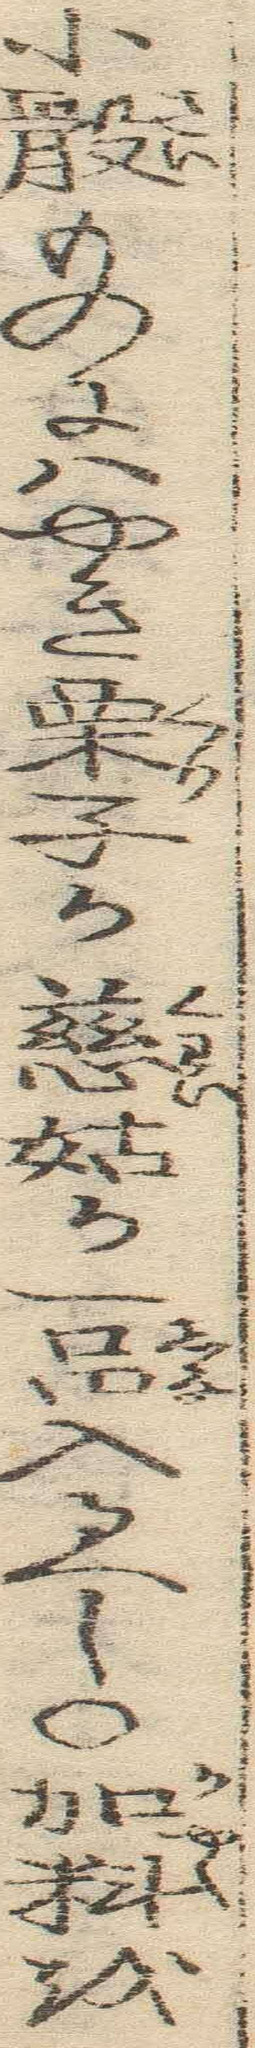小骰ものにはやき栗子か慈姑か一品入るへし○加料を

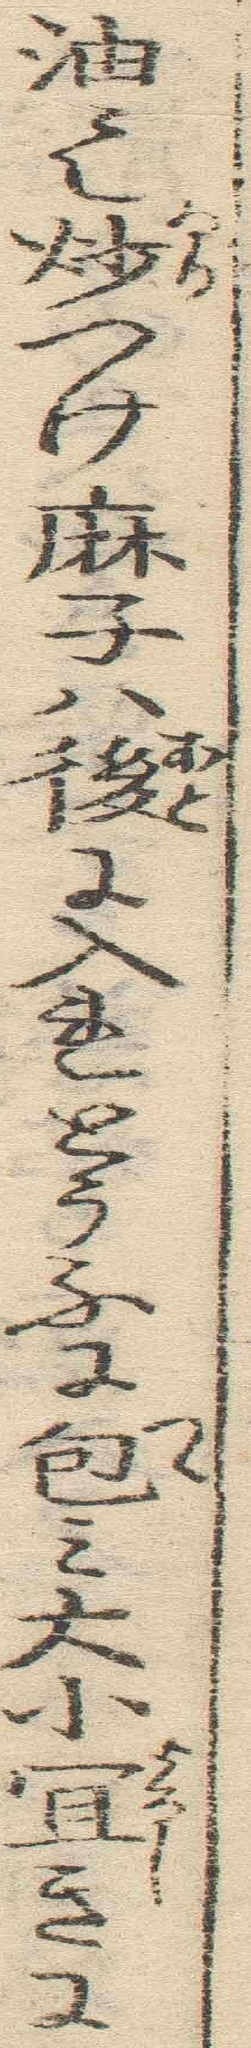油にて炒つけ麻子は後に入れとうふに包み大小宜きに
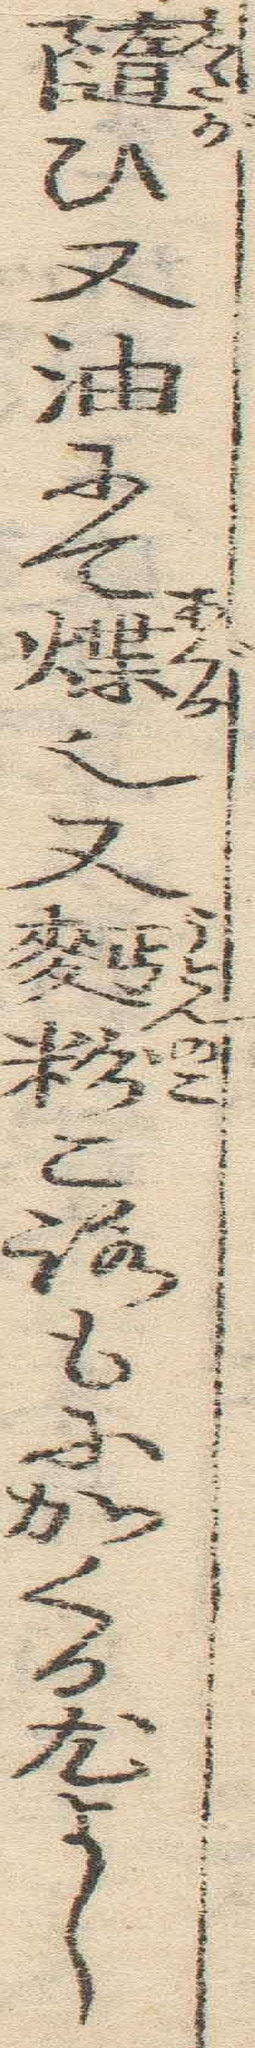随ひ又油にて煠也又麪粉ころもにかくる尤よし
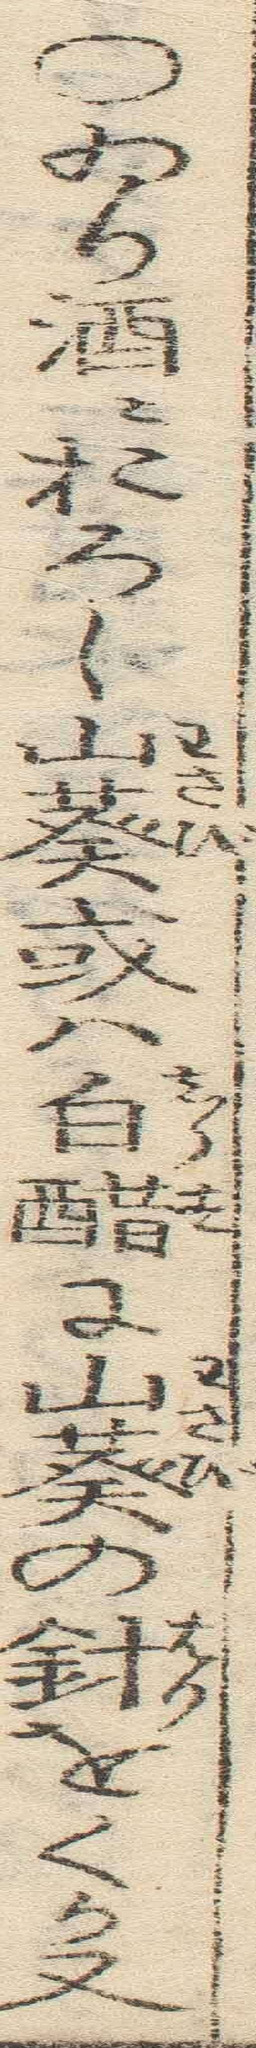○ゐり酒におろし山葵或は白醋に山葵の針をくる又
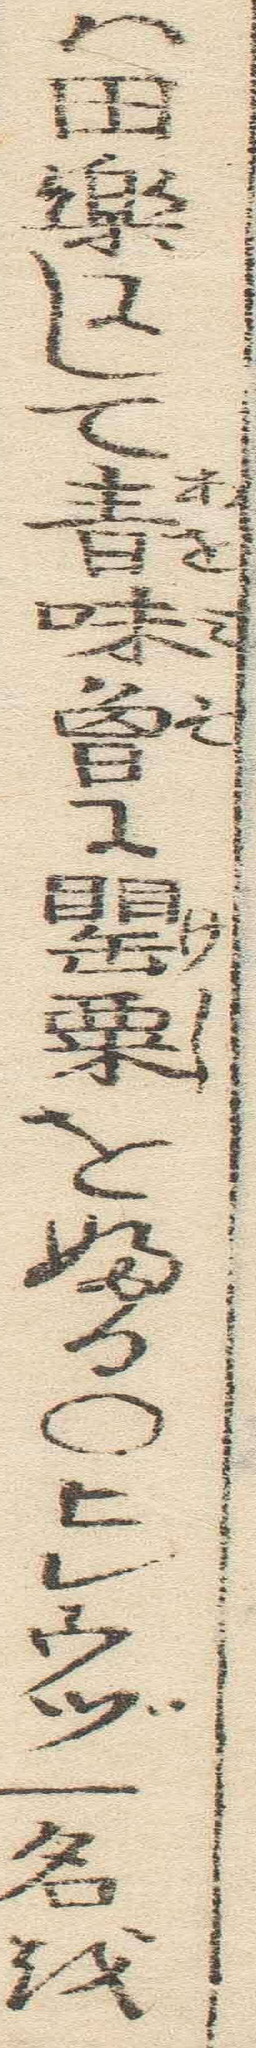は田楽にして青味曽に罌粟をふる○ヒレウヅ一名を
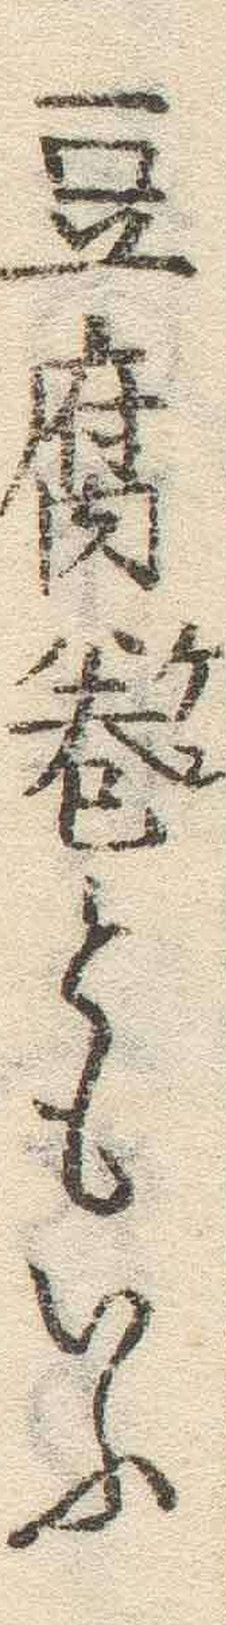豆腐巻ともいふ
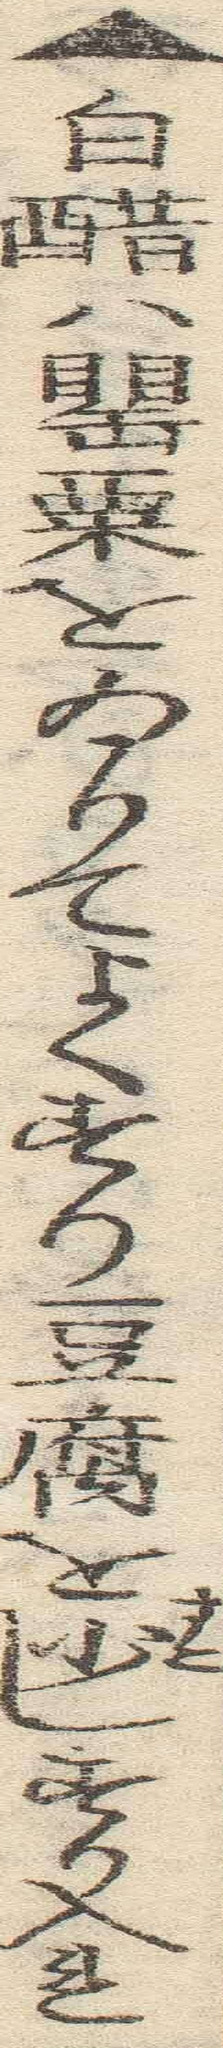▲白醋は罌粟をゐりてよくすり豆腐を少しすり入れ
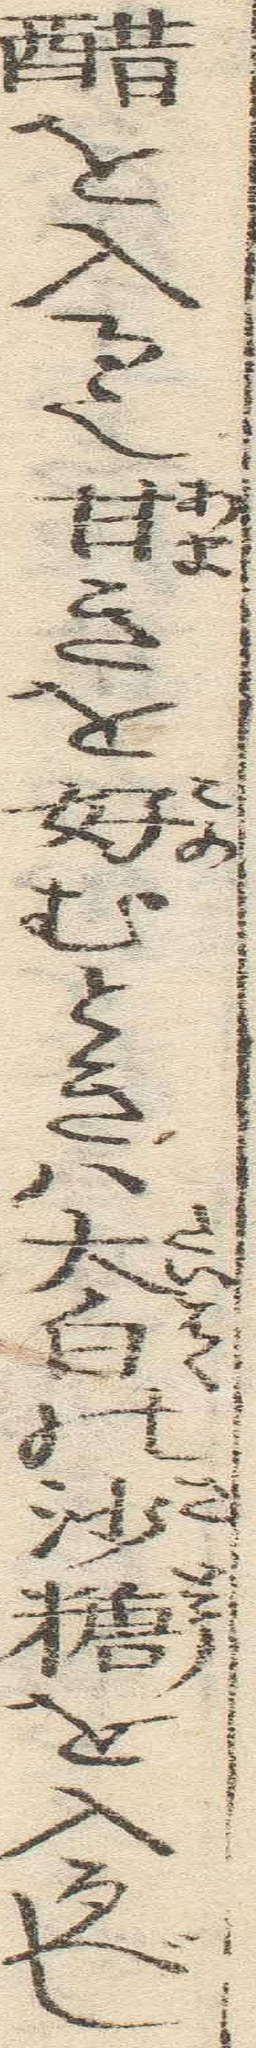醋を入る也甘きを好むときは大白の沙糖を入るべし
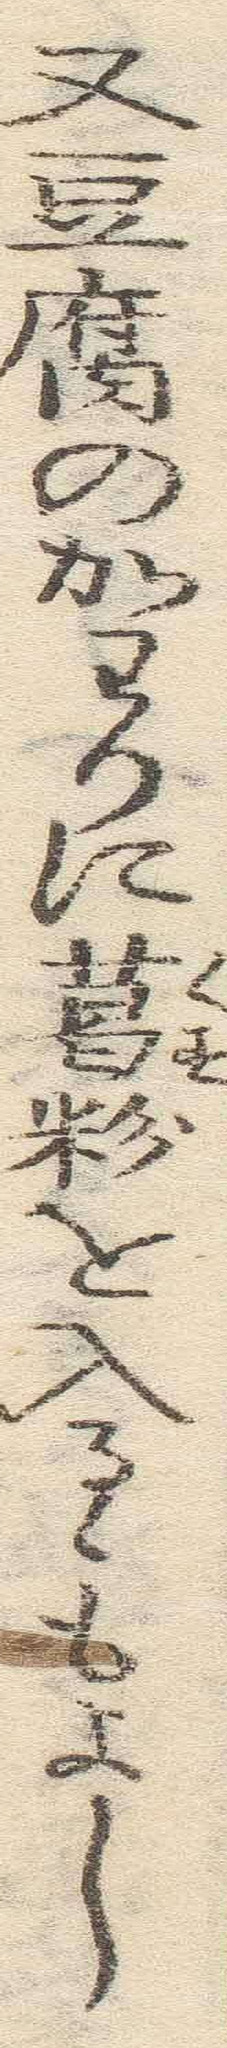又豆腐のかわりに葛粉を入るゝもよし
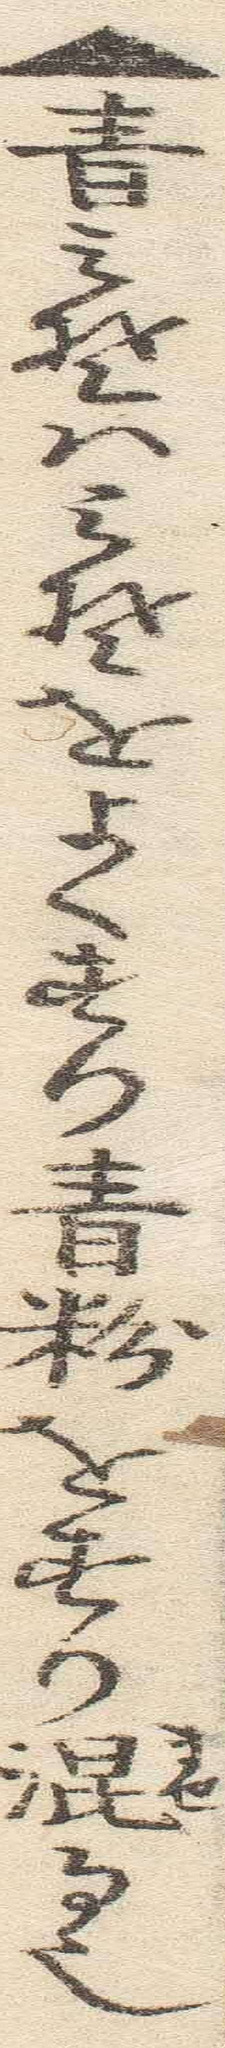▲青みそはみそをよくすり青粉をすり混る也
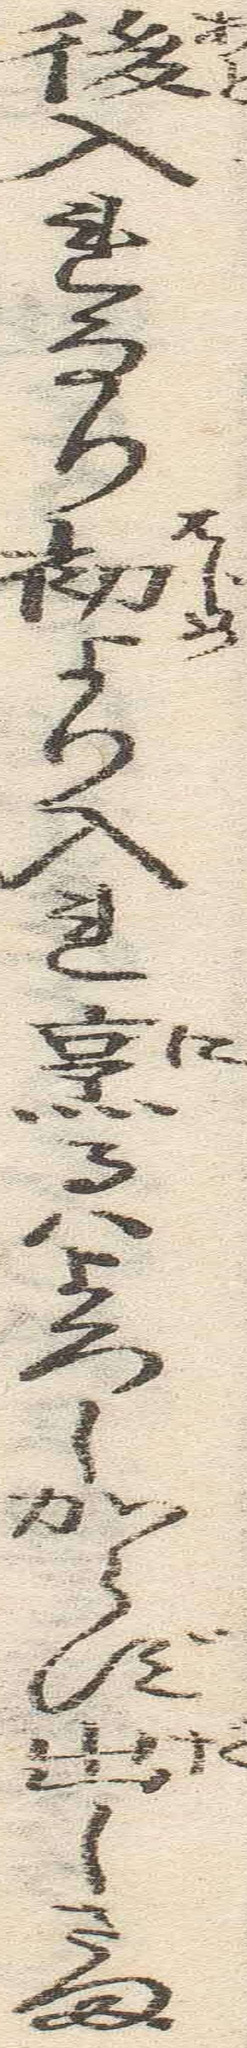後入れなり初より入れ烹るはよろしからず出しさま
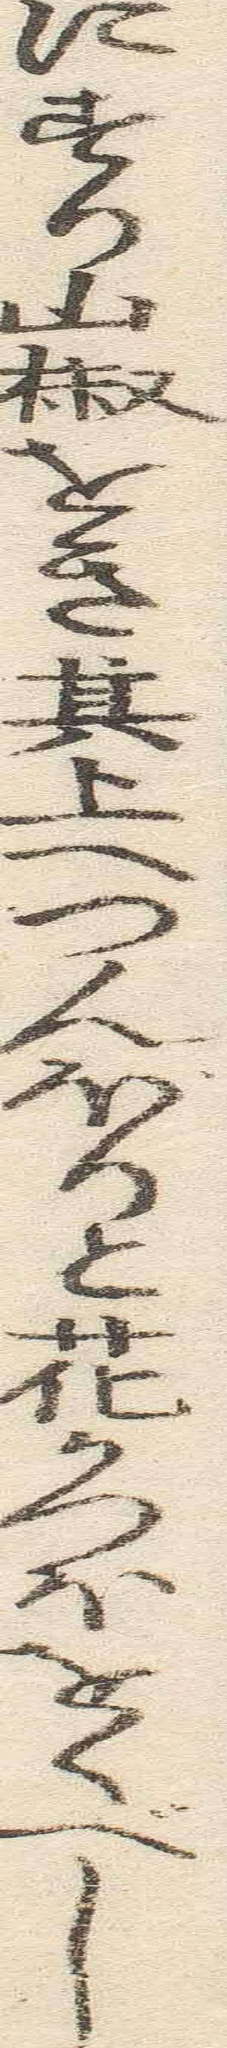にすり山椒をき其上へつんほりと花かつほをくべし
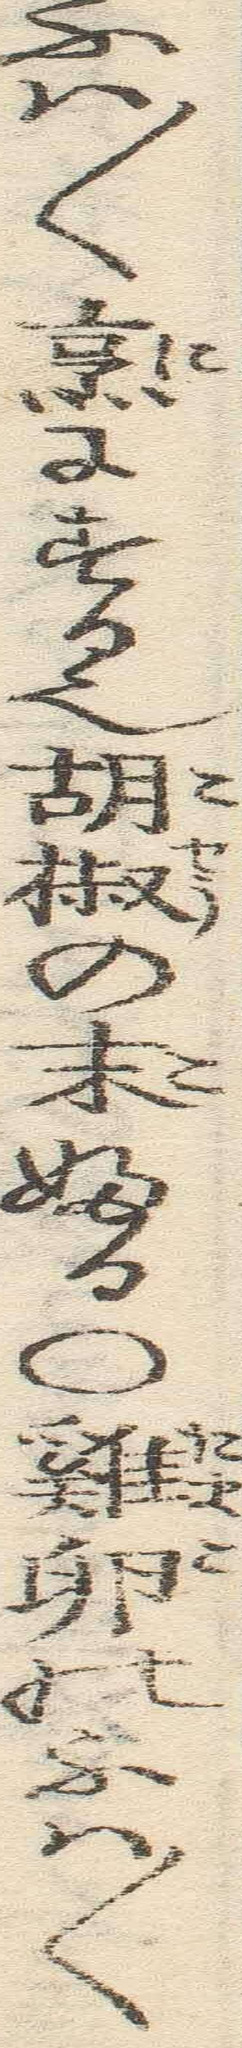ふは〳〵烹にする也胡椒の末ふる○雞卵のふは〳〵
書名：豆腐百珍
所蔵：東京学芸大学附属図書館 国文学研究資料館
